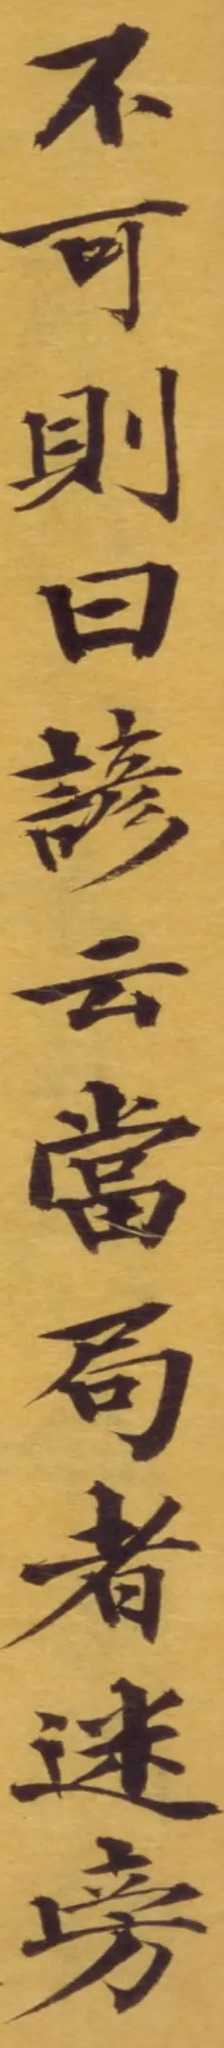不可則曰諺云當局者迷棒旁
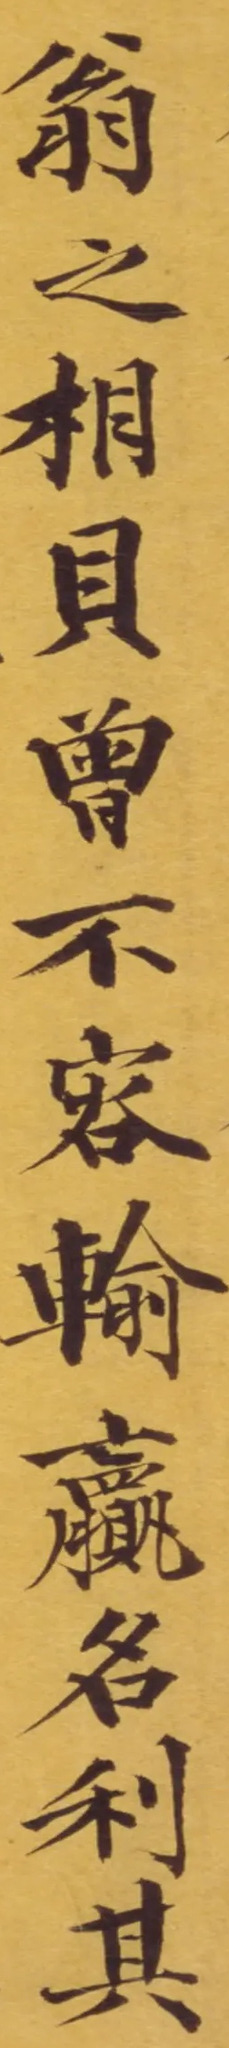翁之相貝曽不容輸贏名利其
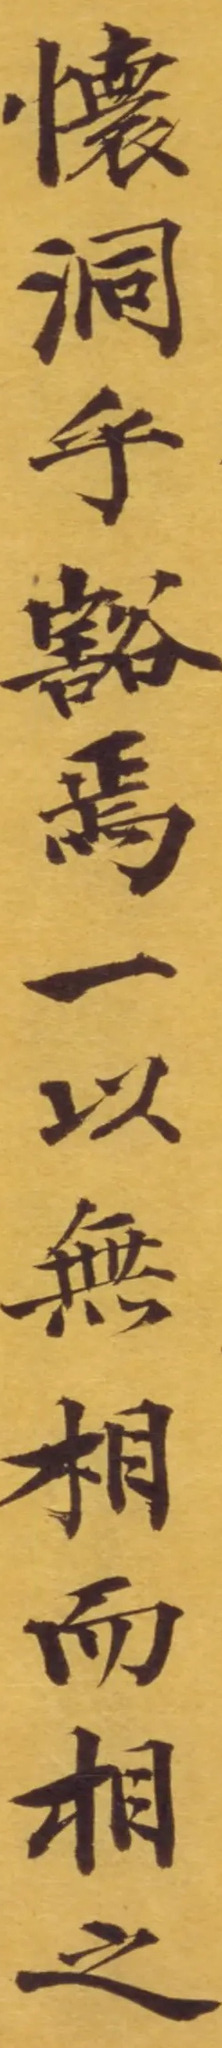懐洞乎豁焉一以無相而相之
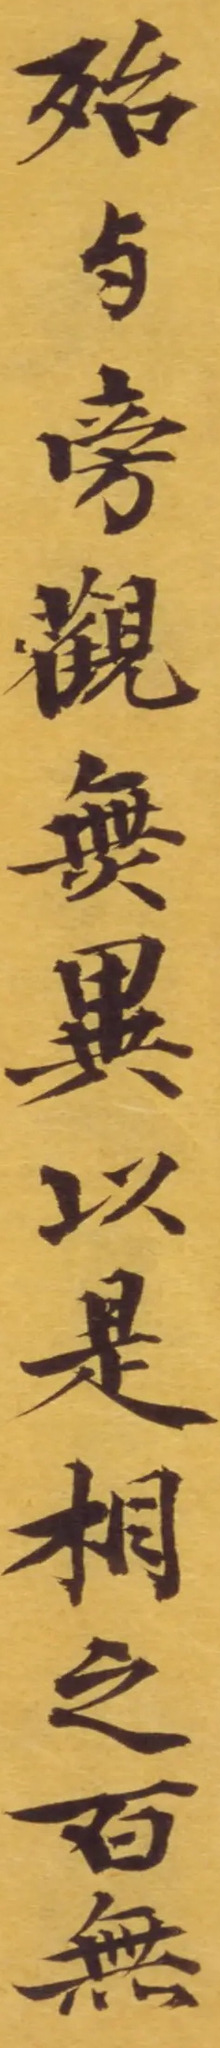殆与旁観無異以之相之百無
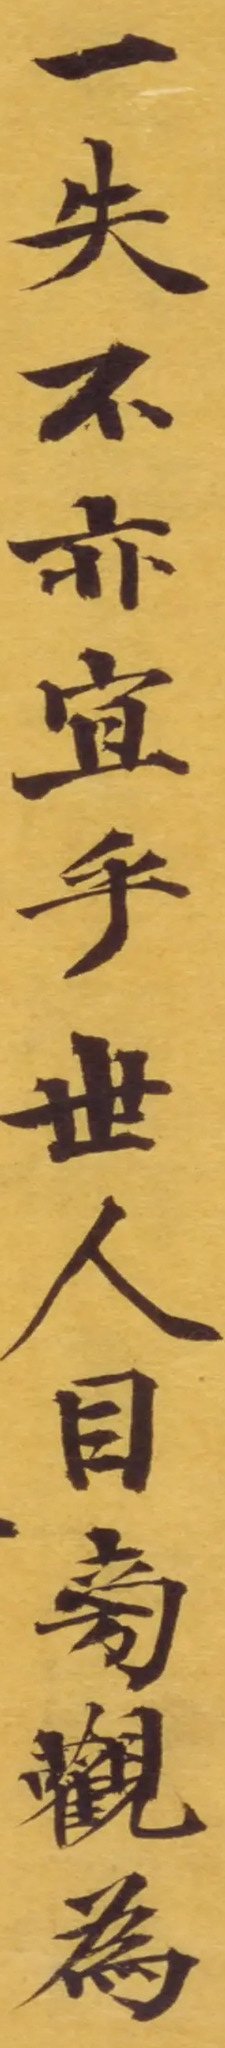一失不亦宜乎世人目旁観為
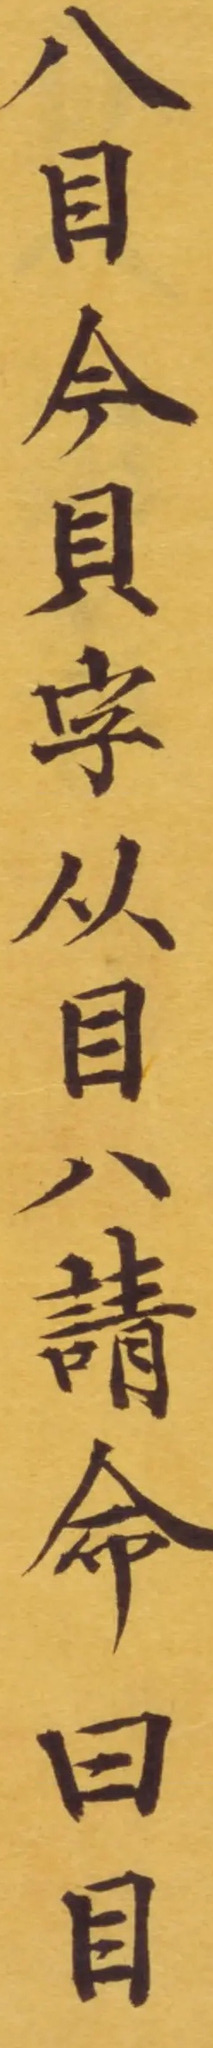八目今貝字从目八請命曰目
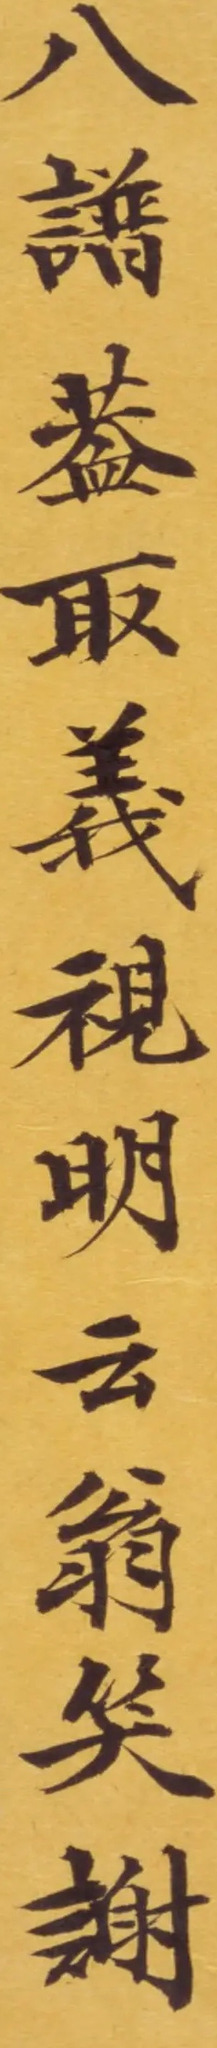八譜葢取義視明云翁笑謝
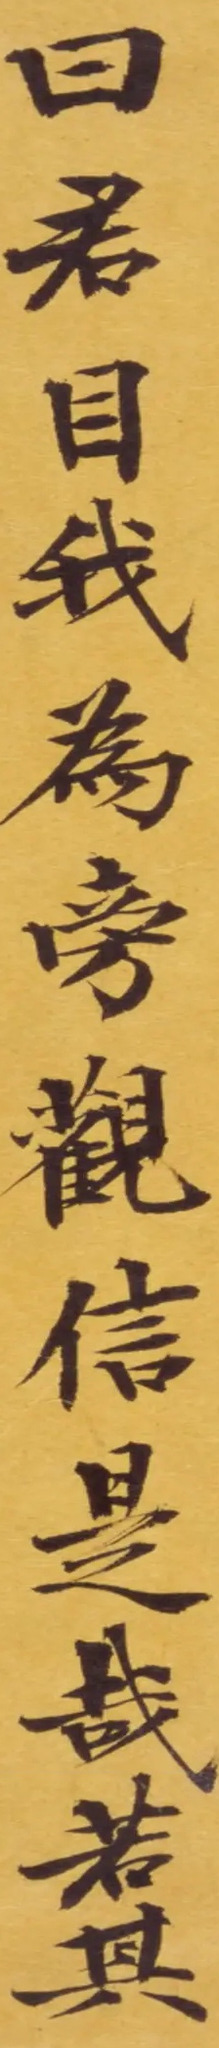曰君目我為旁観信是哉若其
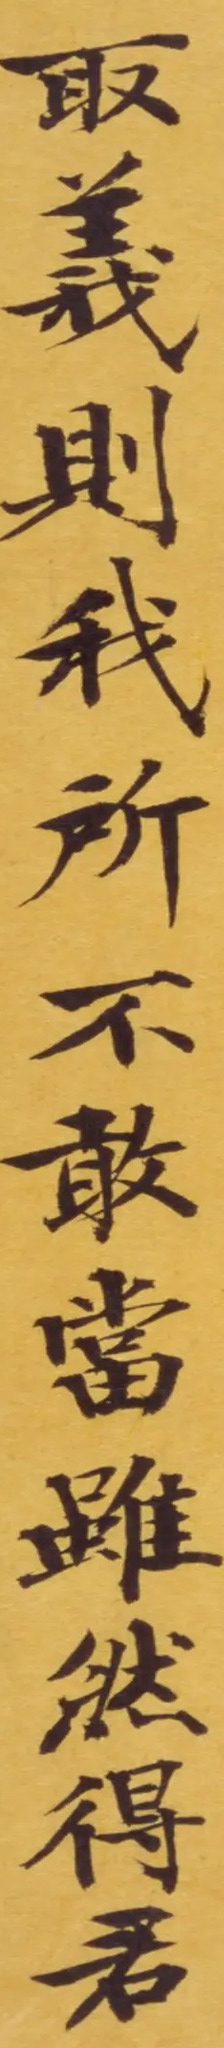取義則我所不敢當雖然得君
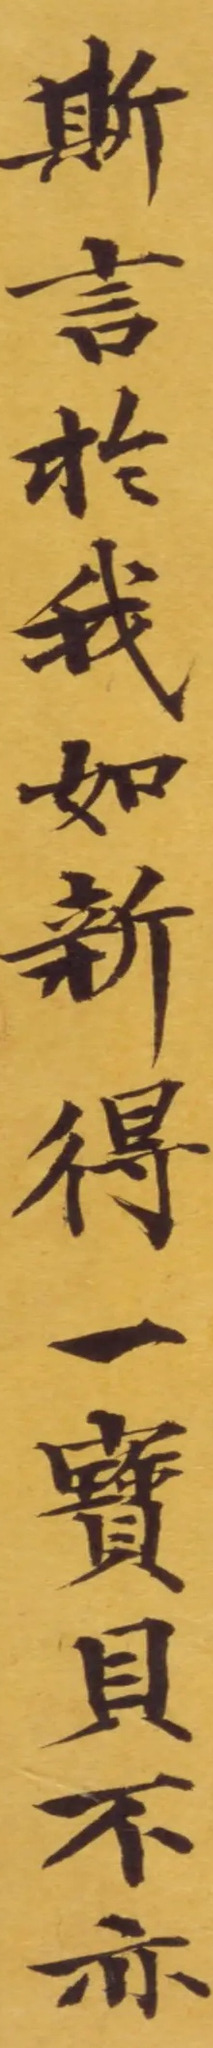斯言於我如信得一寶貝不亦
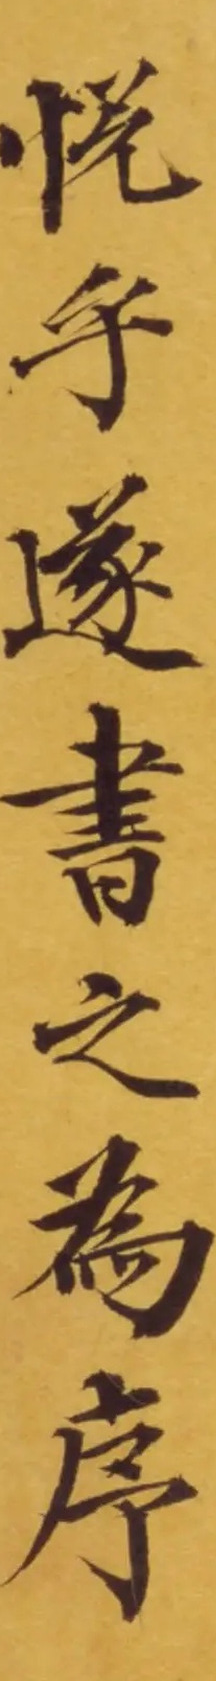悦乎遂書之為序
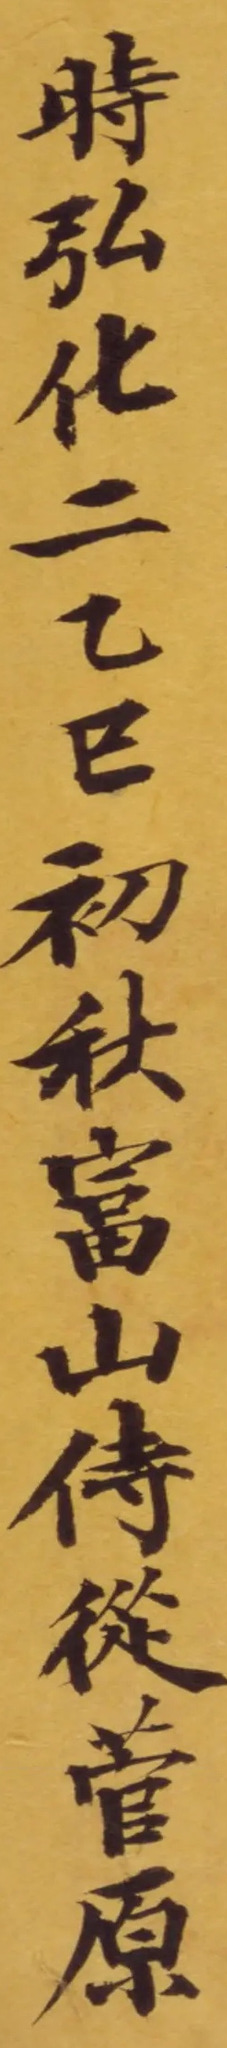時孔化二七巳初秋富山侍從菅原
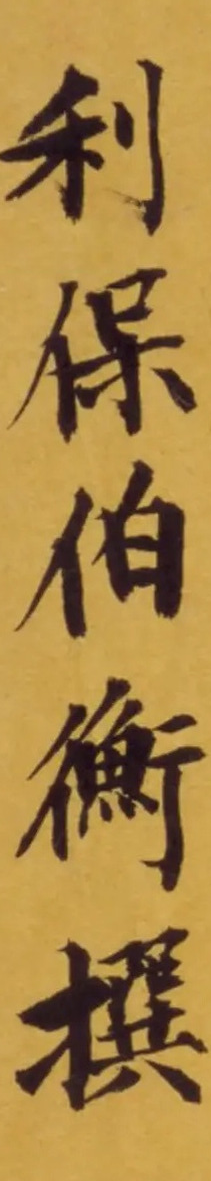利保伯衡撰

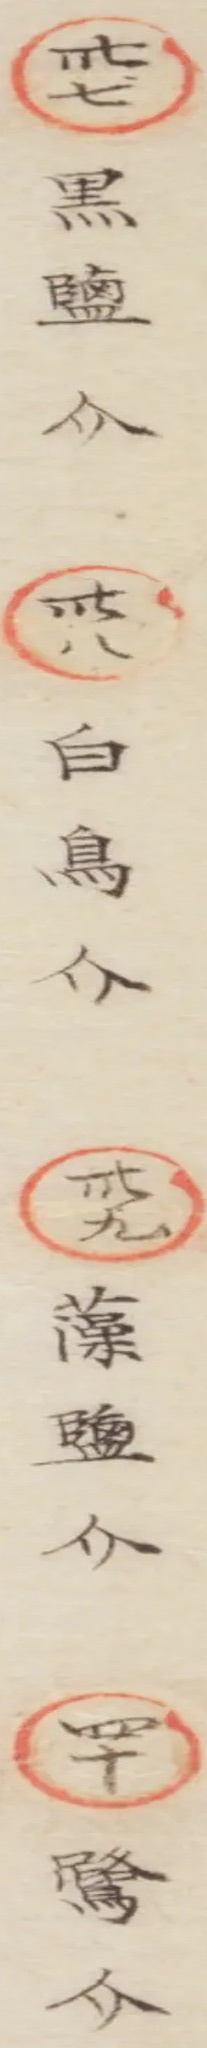卅七黒鹽介卅八白鳥介卅九藻鹽介四十鷺介
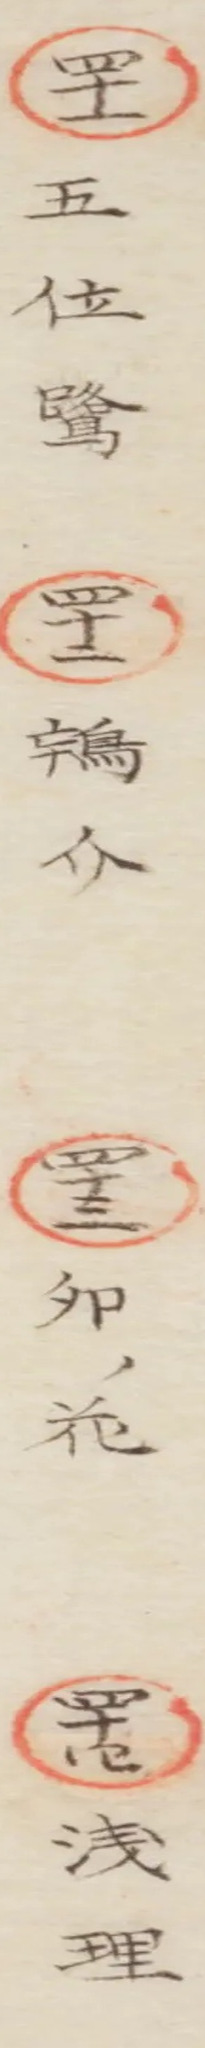四十一五位鷺四十二鴇介四十三夘ノ花四十四浅理
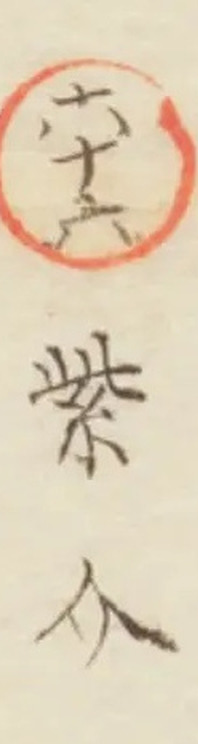六十九皿介
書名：目八譜. 第１巻
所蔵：国立国会図書館 National Diet Library, JAPAN
